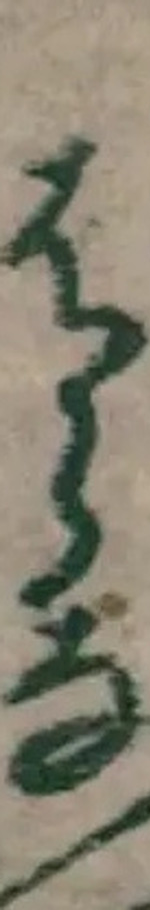はらな
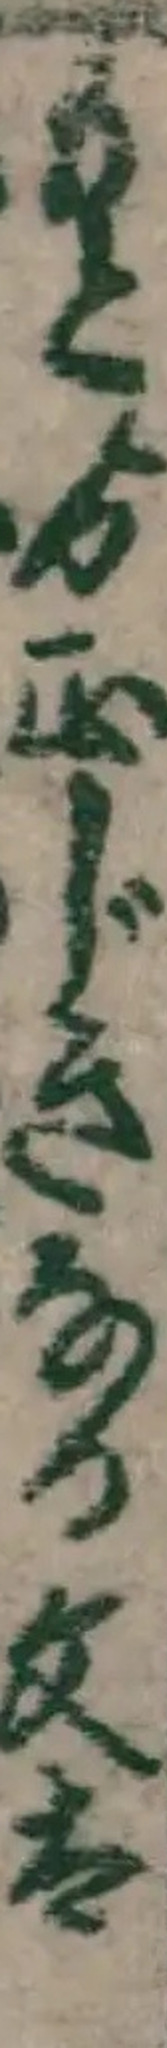もとより正じきなる文太
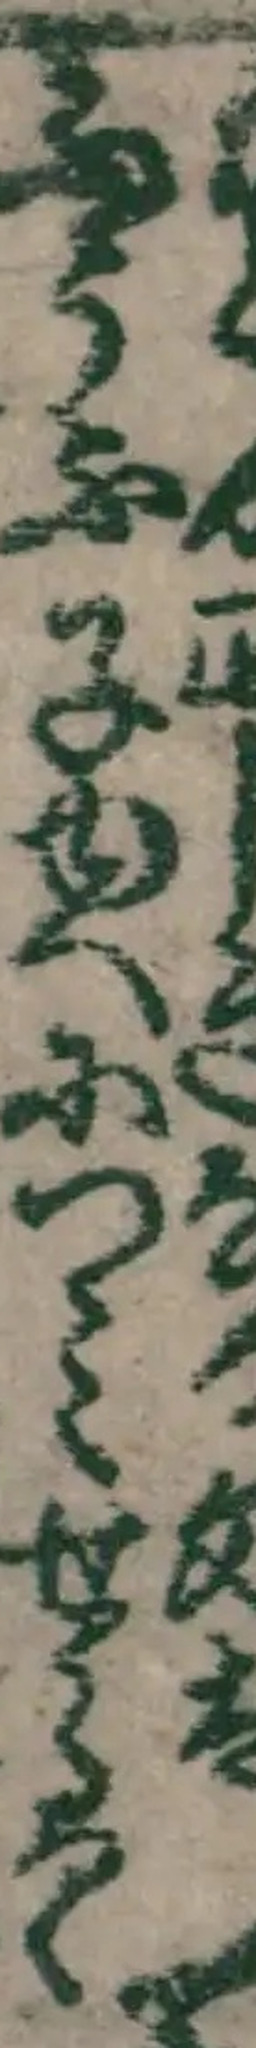ふうふ小ゆへにつみせらるゝ
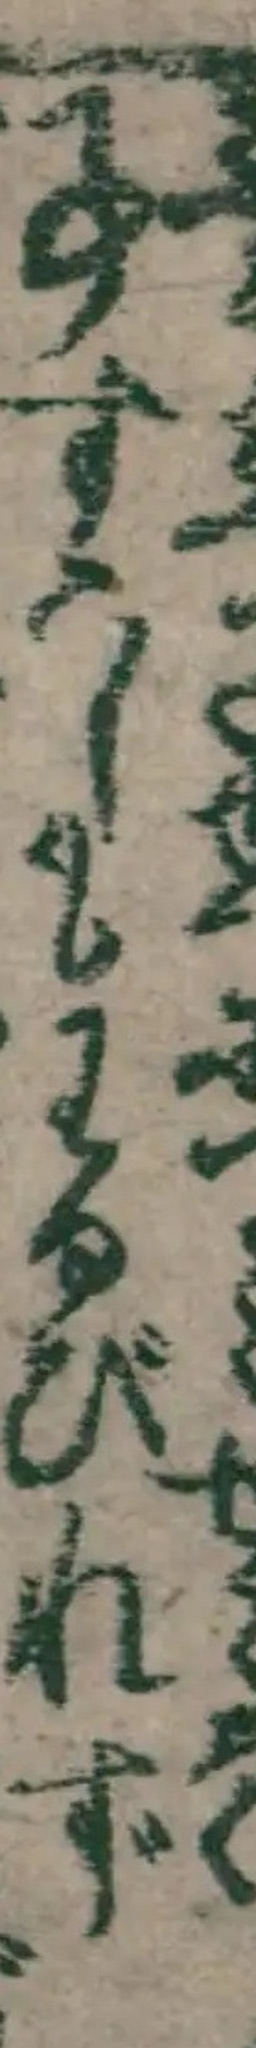事すこしもわるびれず
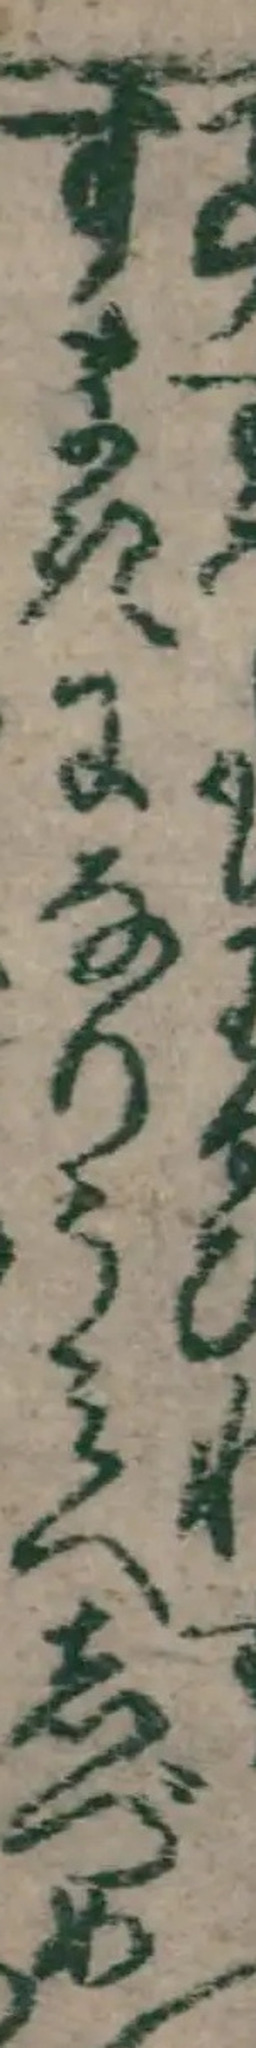すまきになりうみへしづめ
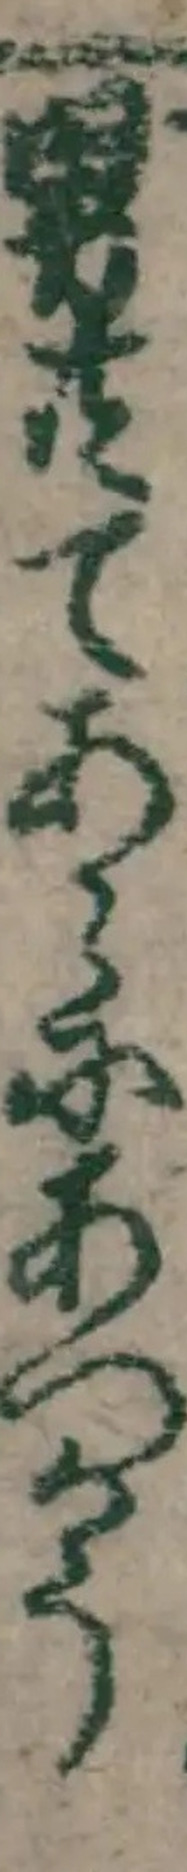男共てあらにあつかう

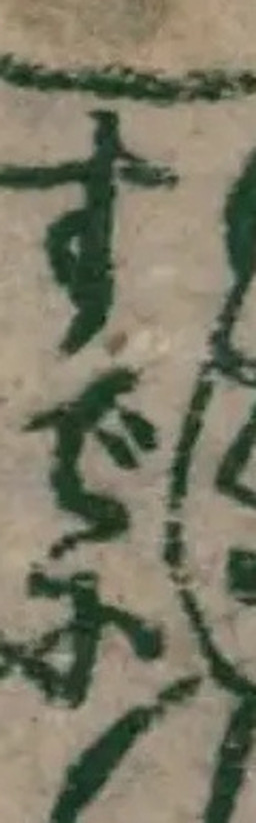すでに
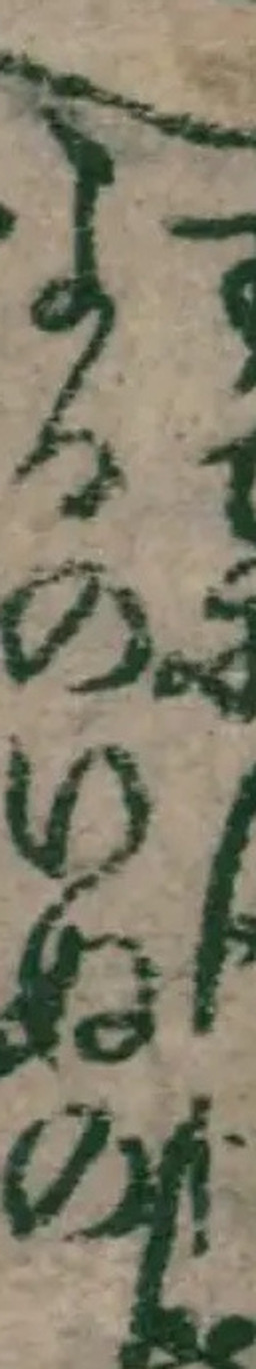よるのいぬの
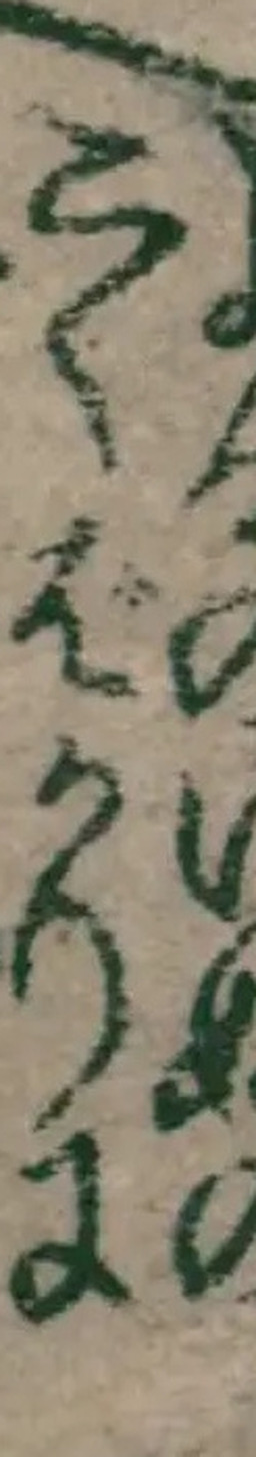こくばかりに
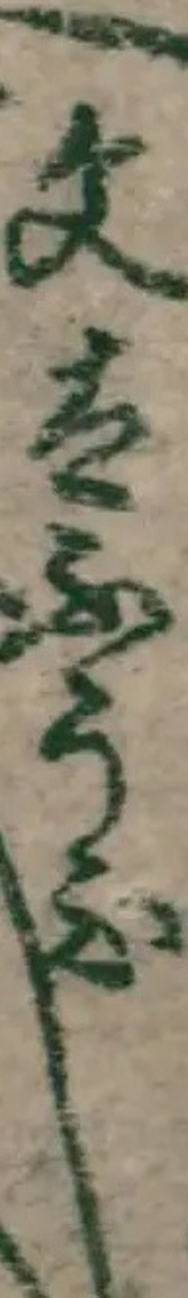文太ふうふ
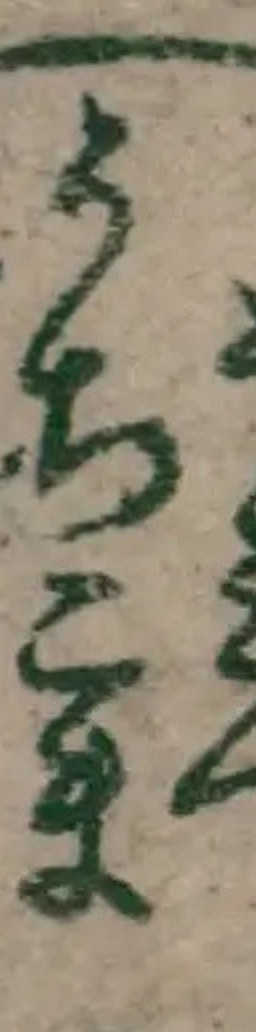うちこま
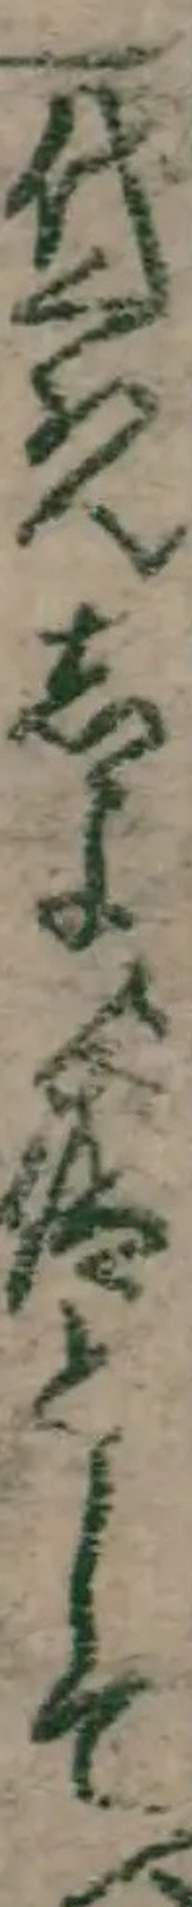代くはんしよより仰として
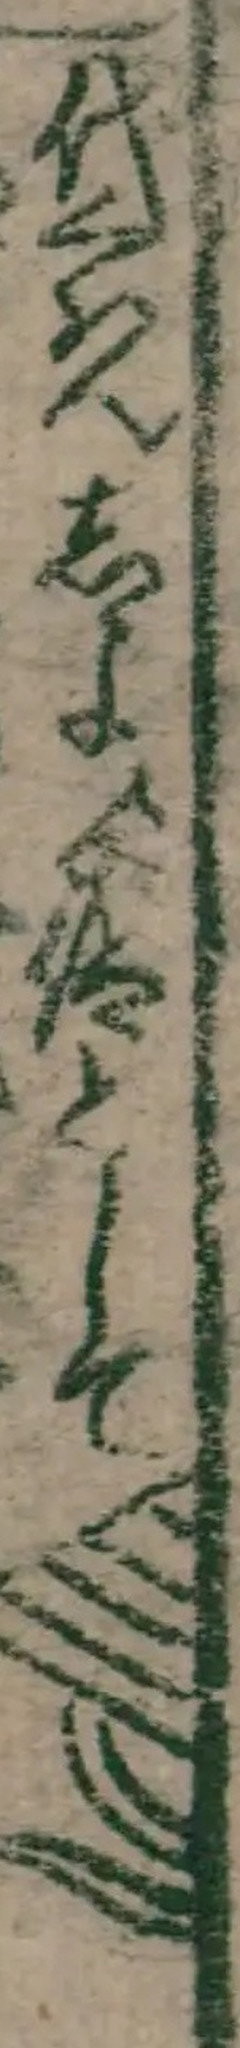代くはんしよより仰として
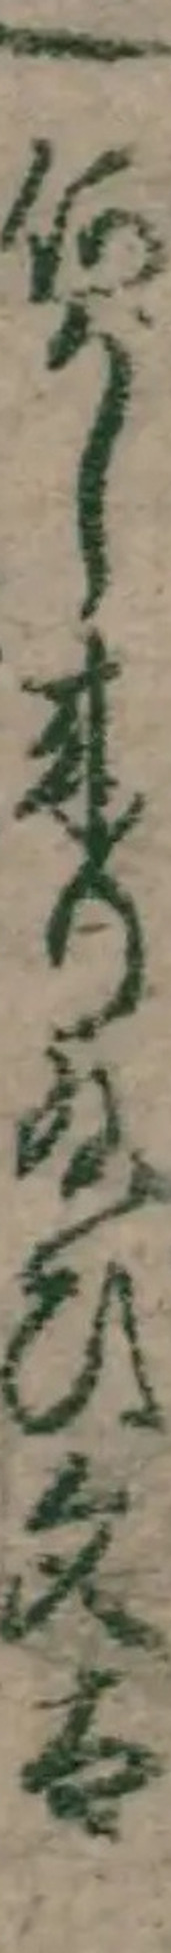何がし来り給ひ文太
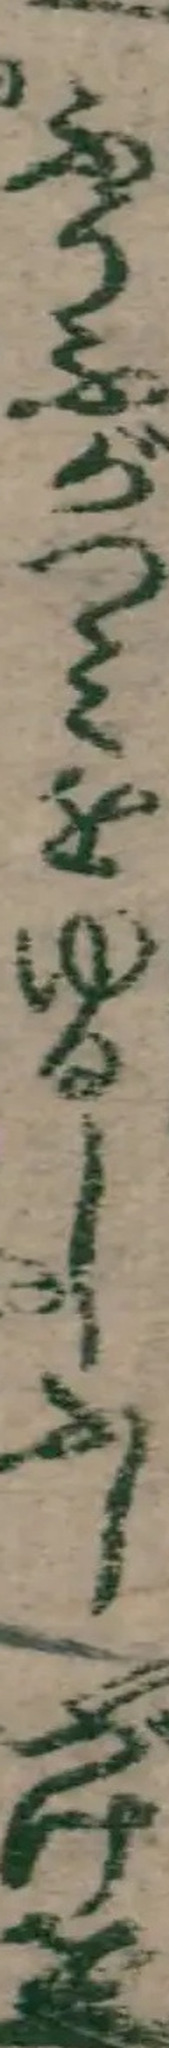ふうふがつみをゆるしふしづけを
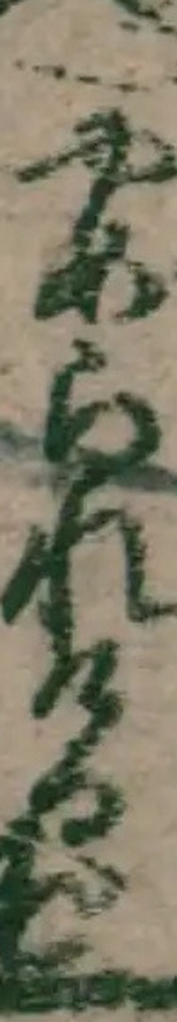やめられけるぞ
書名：塩売文太物語 2巻
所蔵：国立国会図書館 National Diet Library, JAPAN
